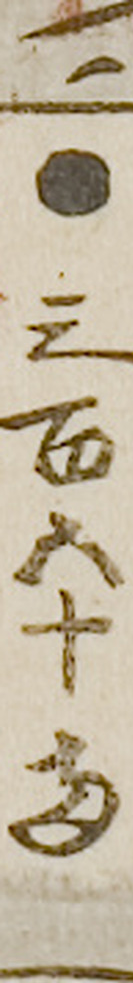●百五十両
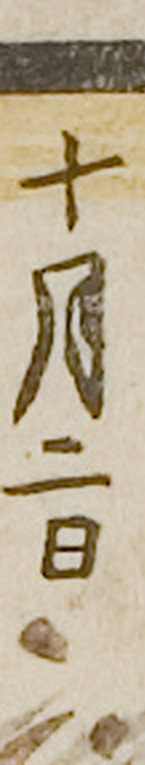十月二日
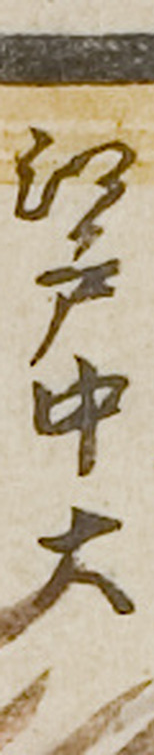江戸中大
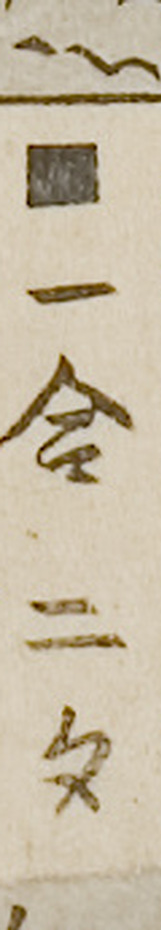一合二勺
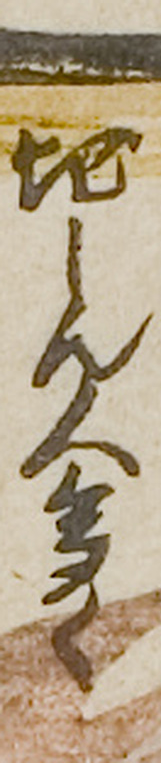地しん人多く
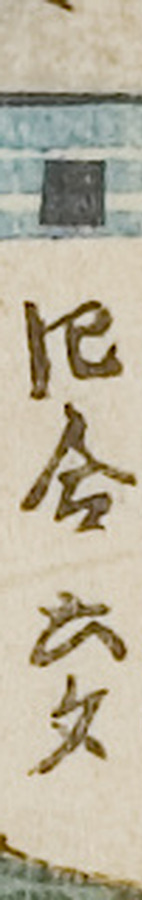四合六勺
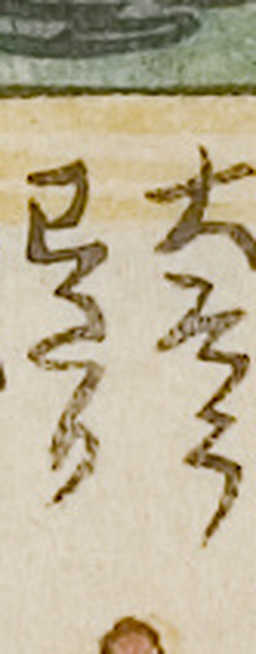わたり
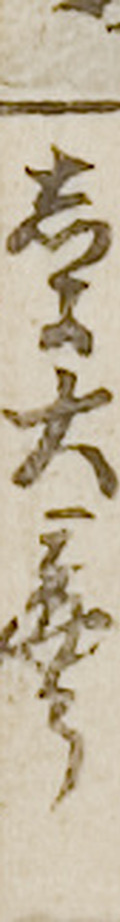しよ大みやう
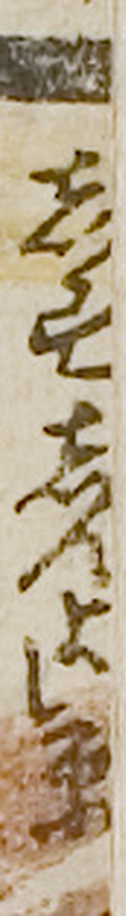しすしんよし原
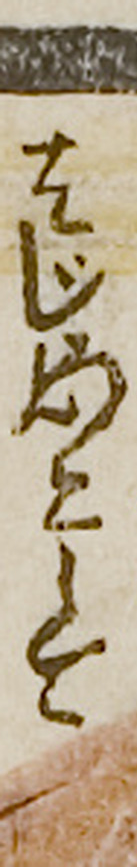はじめとして
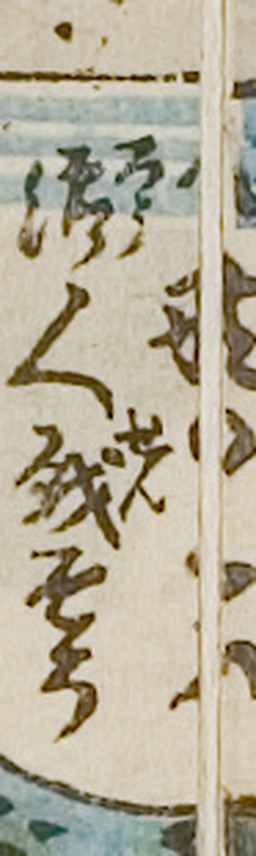浪人戦そう
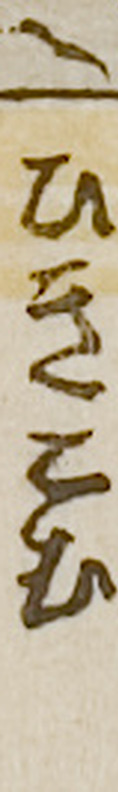ひきこむ
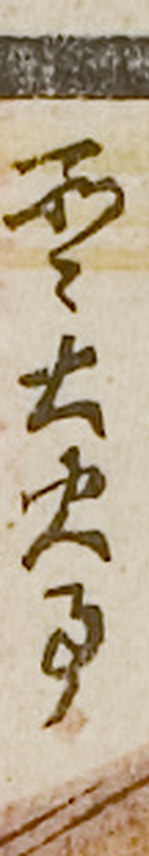所々大火事
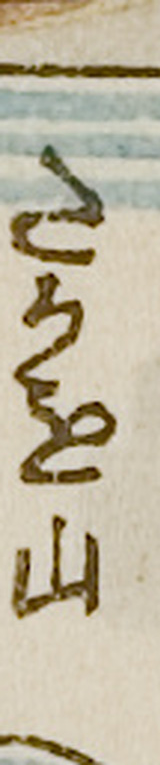たかを山
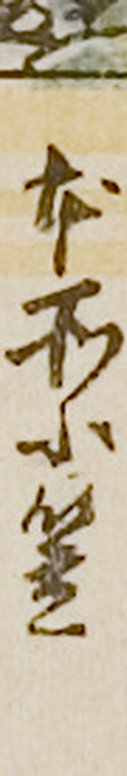本所小笠
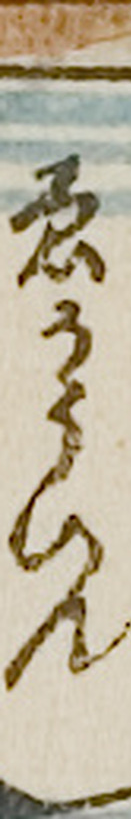ゑかういん
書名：嘉永年間より米相場直段并年代記書抜大新版
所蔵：東京大学総合図書館 General Library in the University of Tokyo, JAPAN
